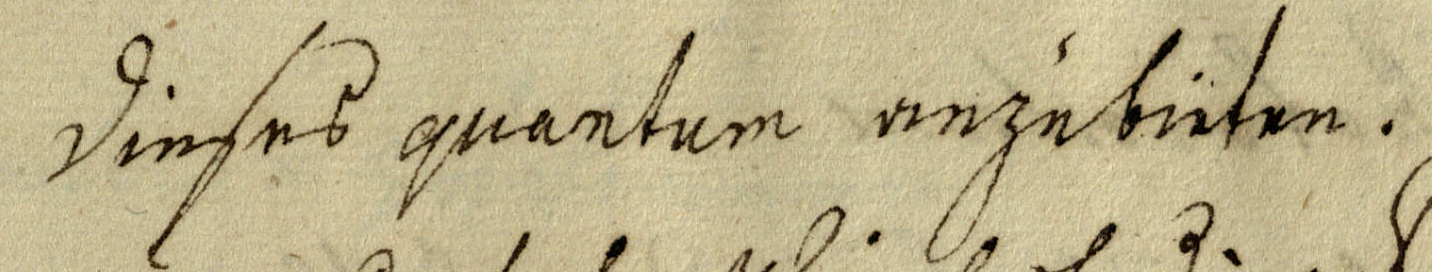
dieses Quantum anzubieten.
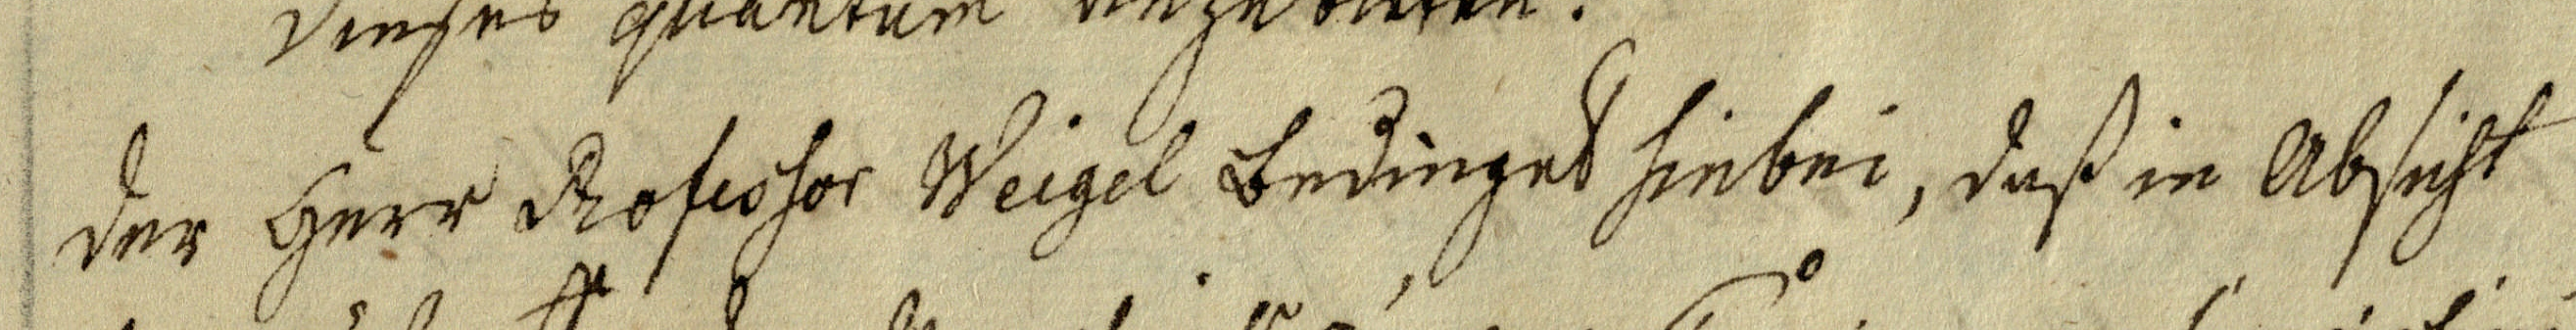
Der Herr Professor Weigel bedinget hiebei, daß in Absicht
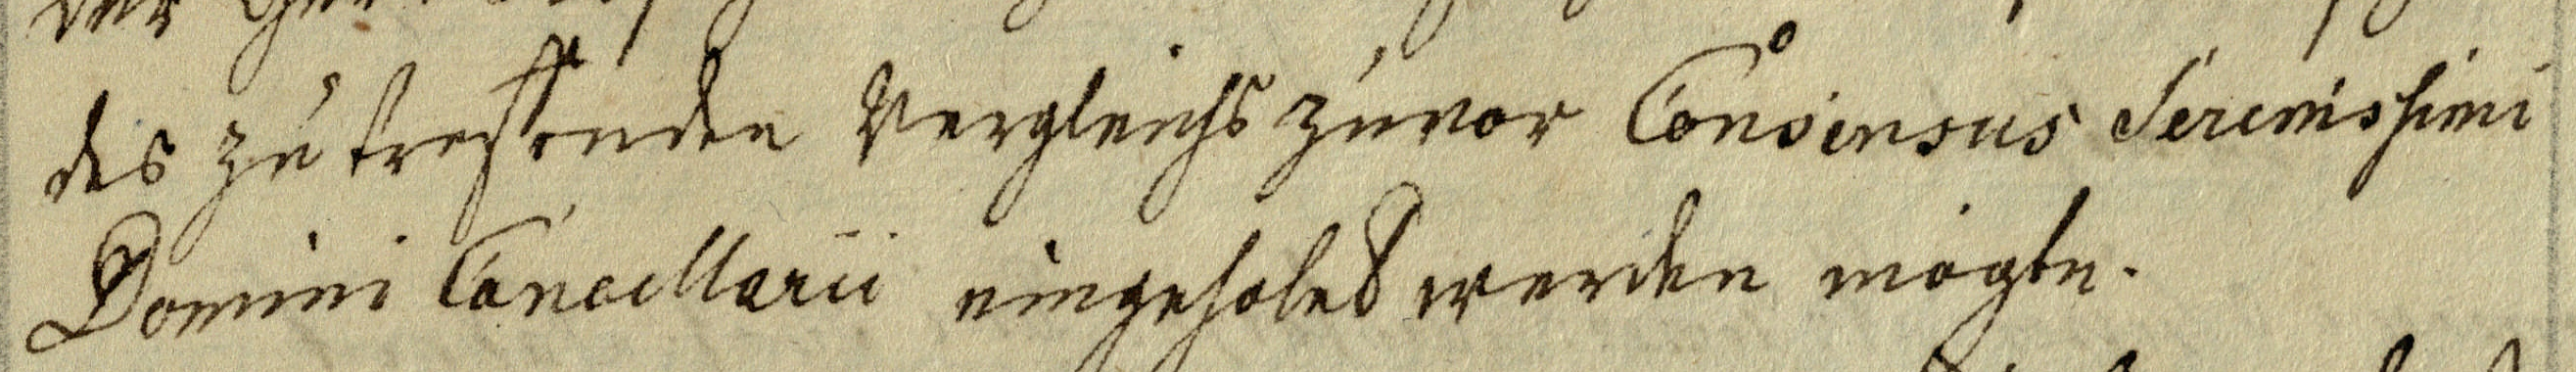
des zu treffenden Vergleichs zuvor Consensus Serenissimi
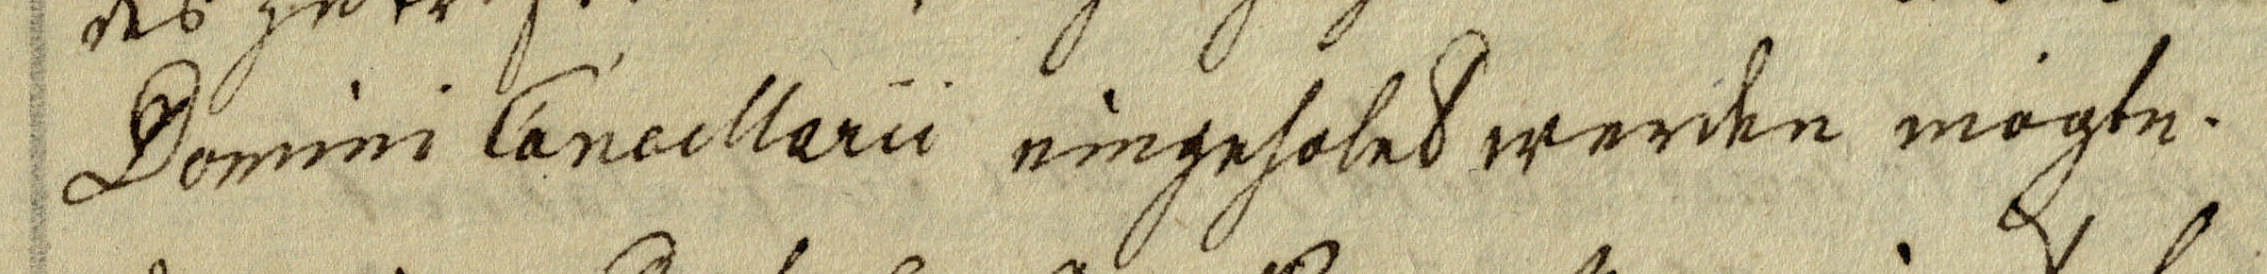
Domini Cancellarii eingeholet werden mögte.
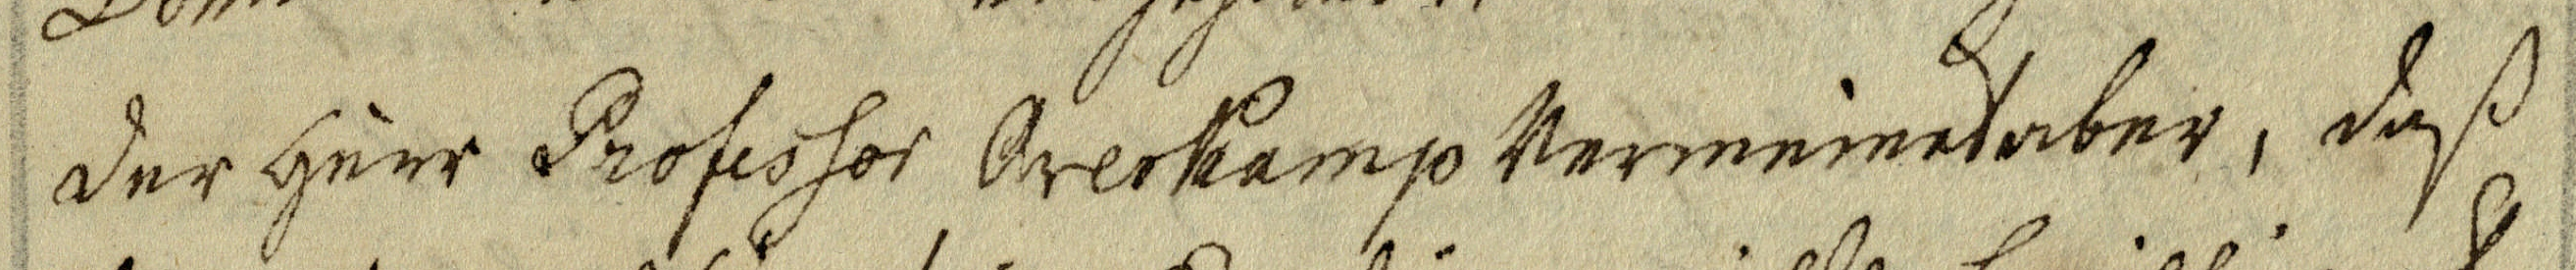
Der Herr Professor Overkamp vermeinet aber, daß
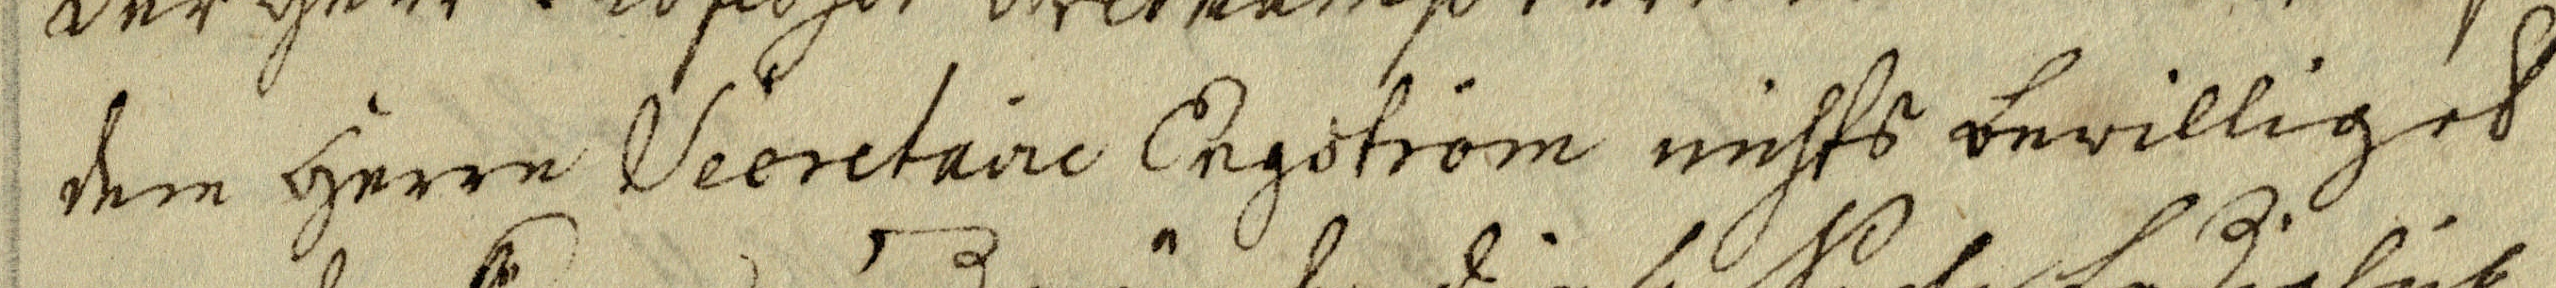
dem Herrn Secretaire Engström nichts bewilliget
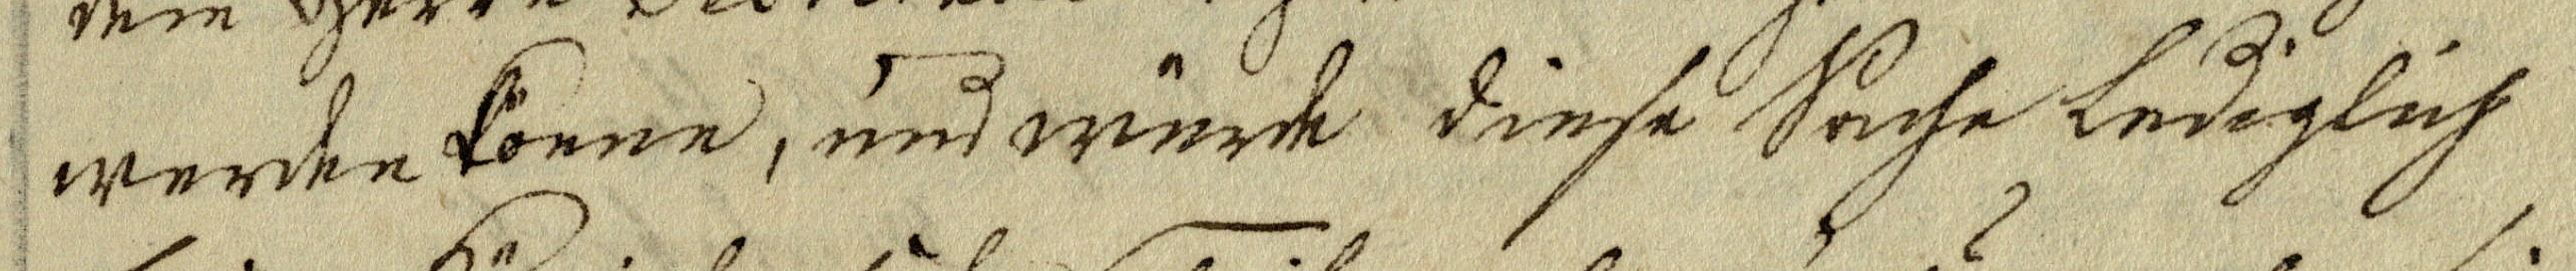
werden könne, und würde diese Sache lediglich
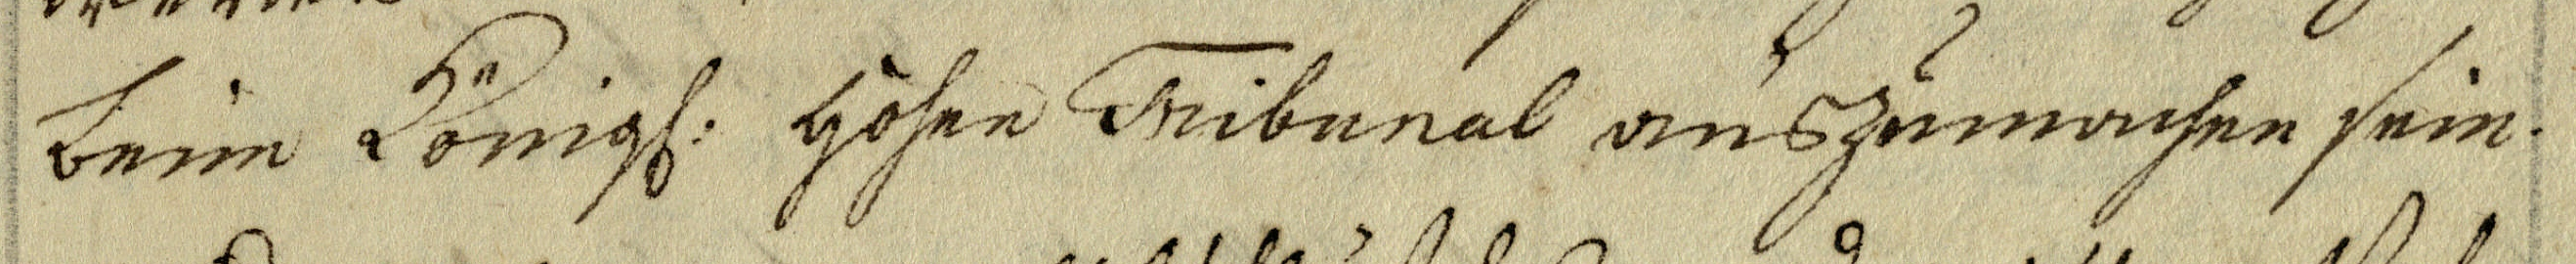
beim Königl: Hohen Tribunal auszumachen sein.
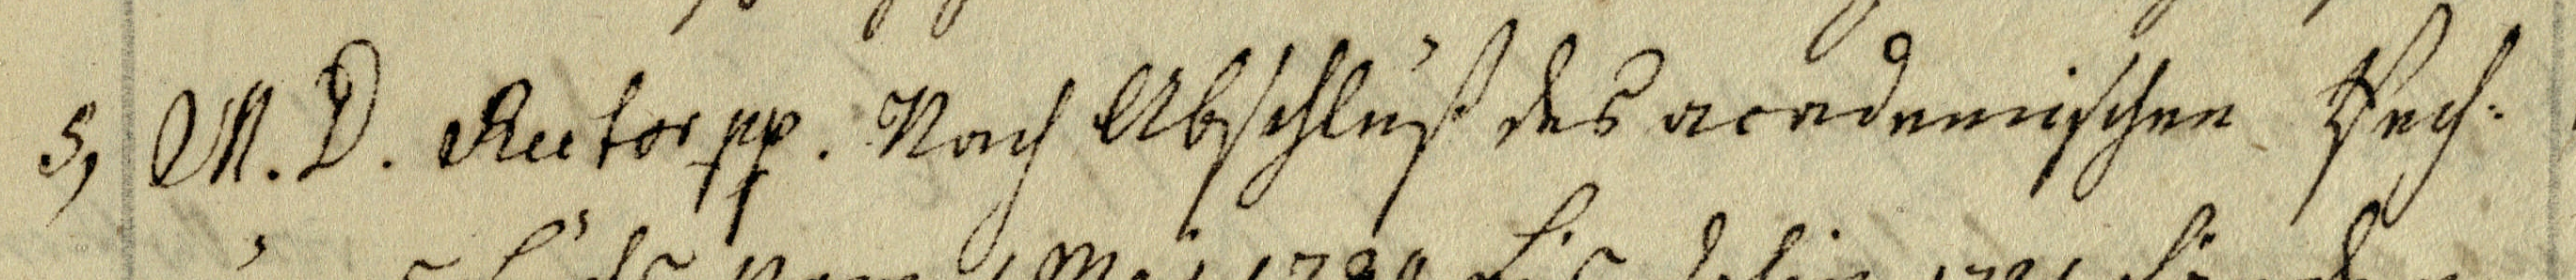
M. D. Rector pp. Nach Abschluß des academischen Rech¬
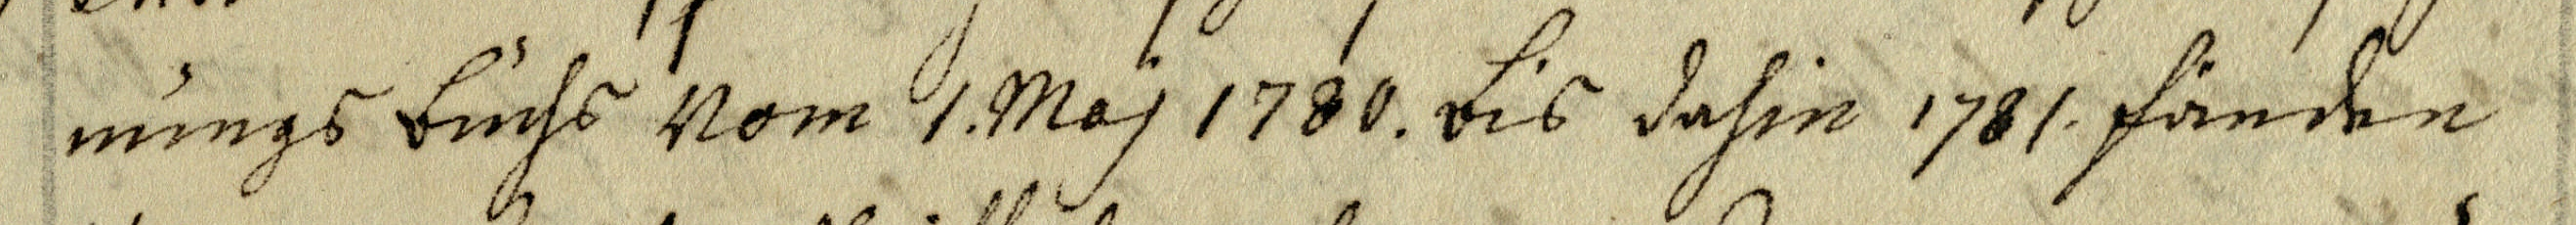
nungs Buchs vom 9. Maj 1780. bis dahin 1781 fänden
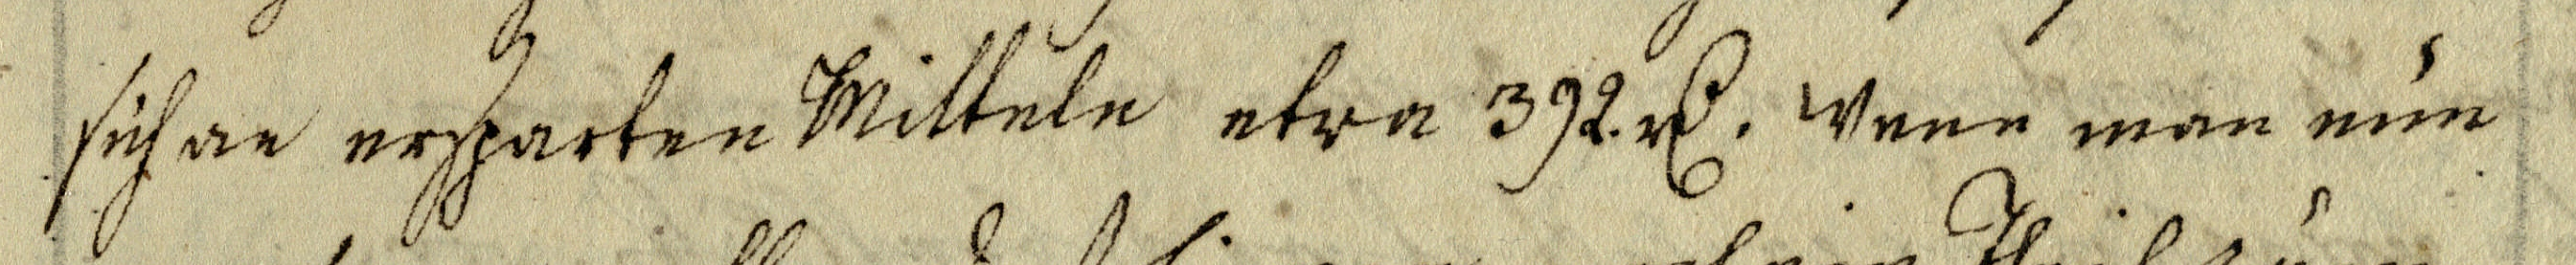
sich an ersparten Mitteln etwa 392. r. wenn man nun
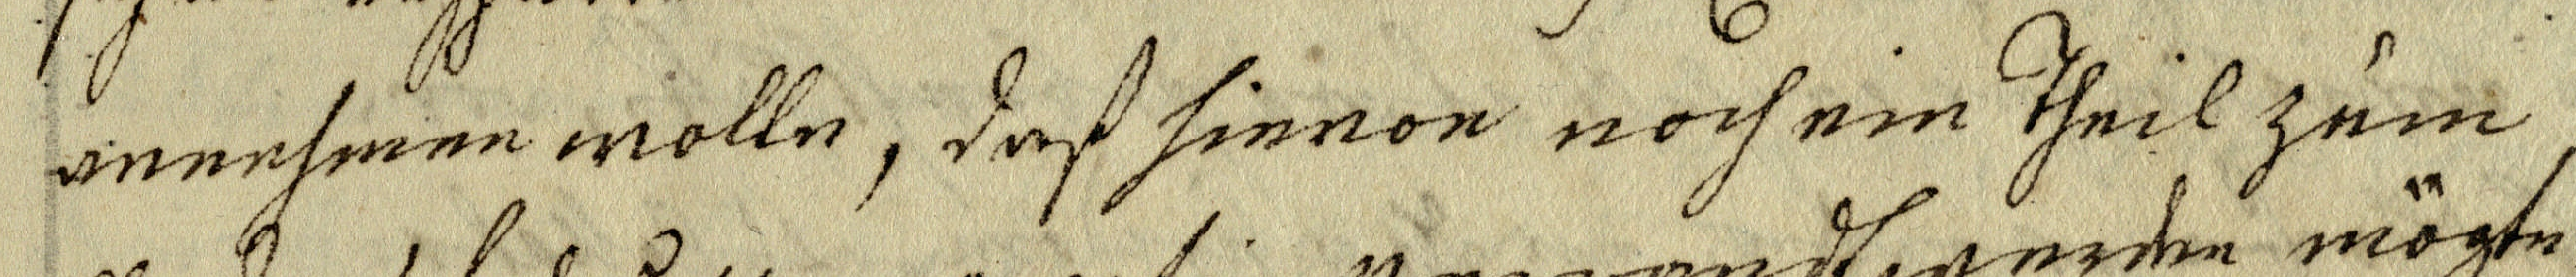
annehmen wolle, daß hievon noch ein Theil zum
